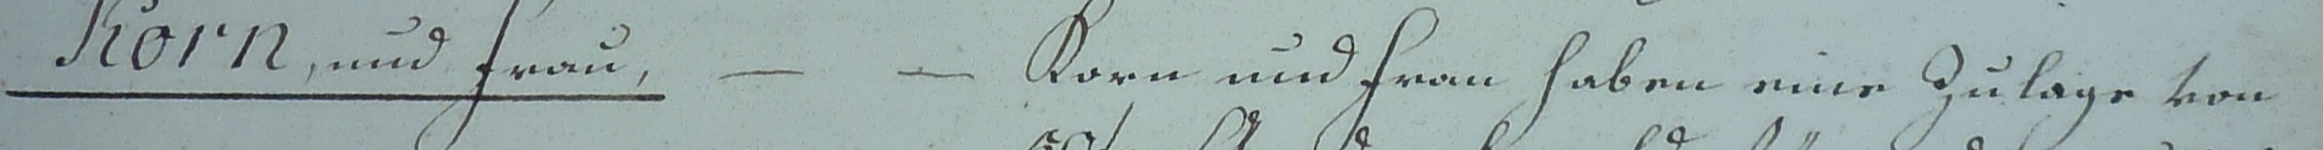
Korn, und Frau, _ _ Korn und Frau haben eine Zulage von
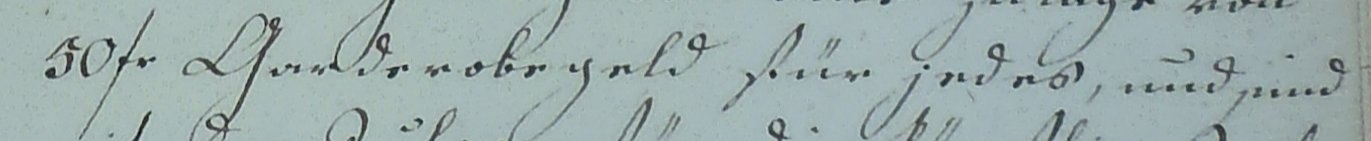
50fr Garderobegeld für jedes, und sind
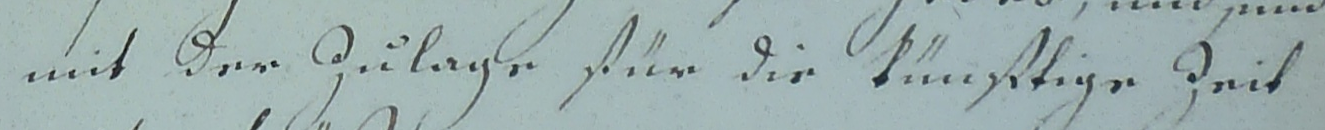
mit der Zulage für die künftige Zeit
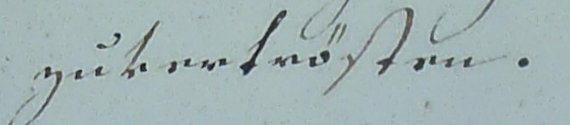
zuvertrösten.
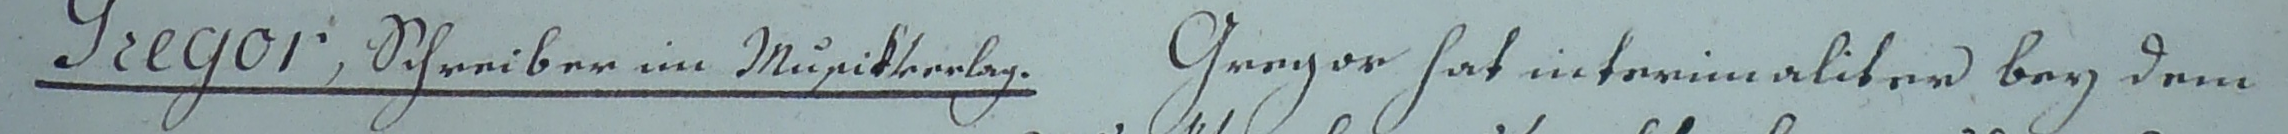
Gregor, Schreiber im Musikverlag. Gregor hat interim aliter bey dem
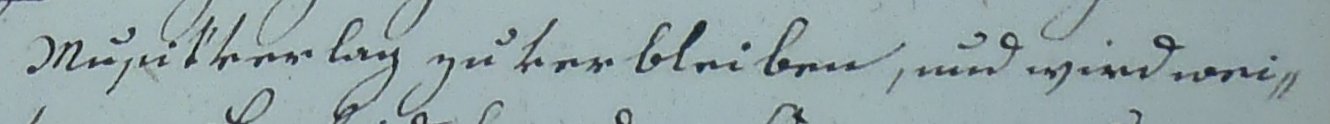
Musikverlag zuverbleiben, und wird wei¬
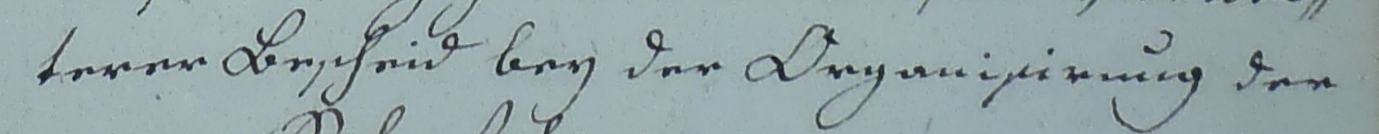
terer Bescheid bey der Organisirung der
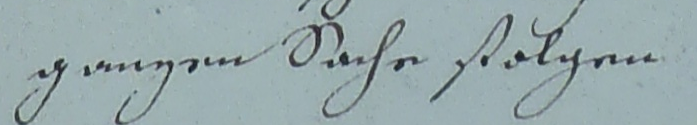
ganzen Sache folgen.
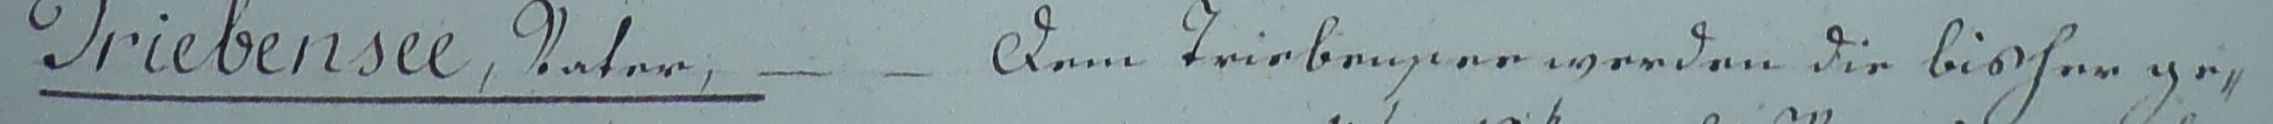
Triebensee, Vater, _ _ Dem Triebensee werden die bisher ge¬
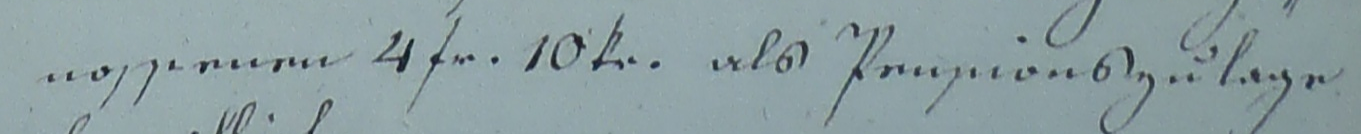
nossenen 4 fr. 10 kr. als Pensionszulage
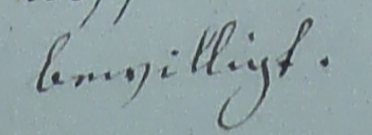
bewilligt.
